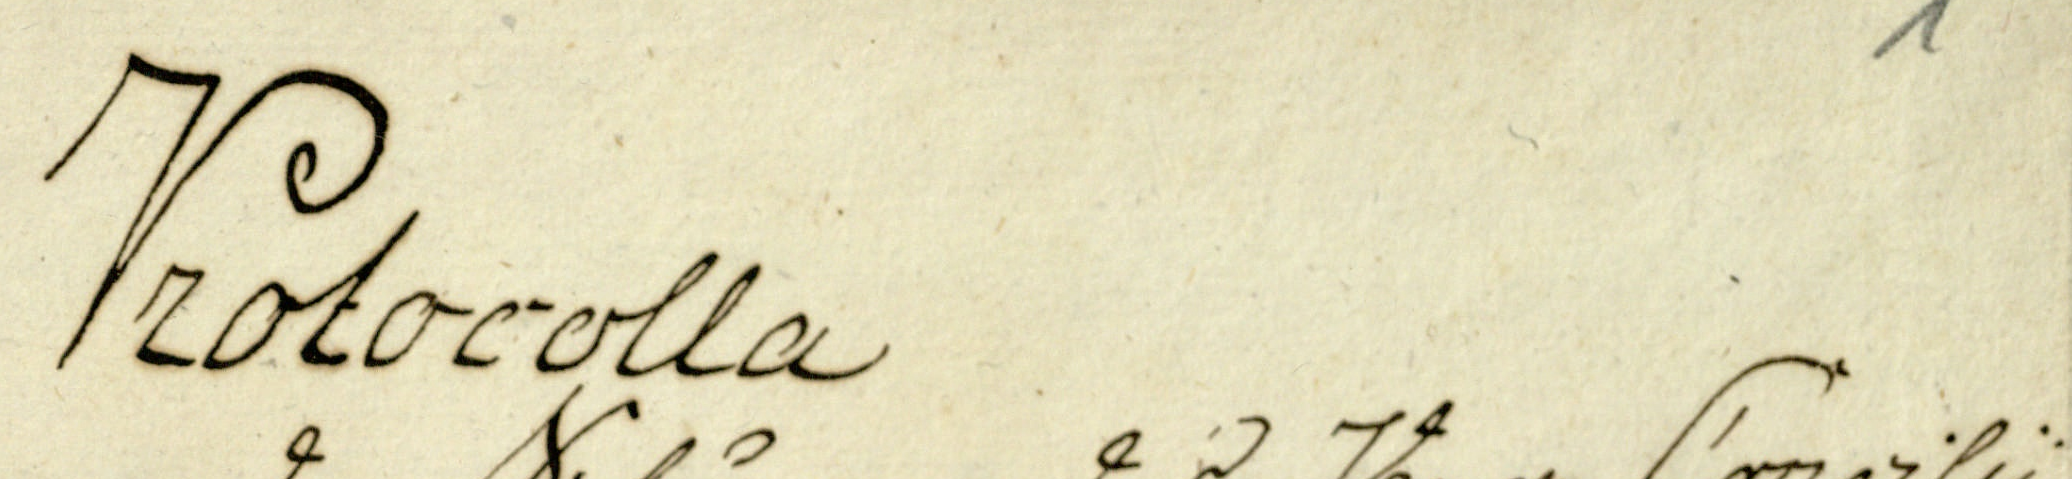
Protocolla
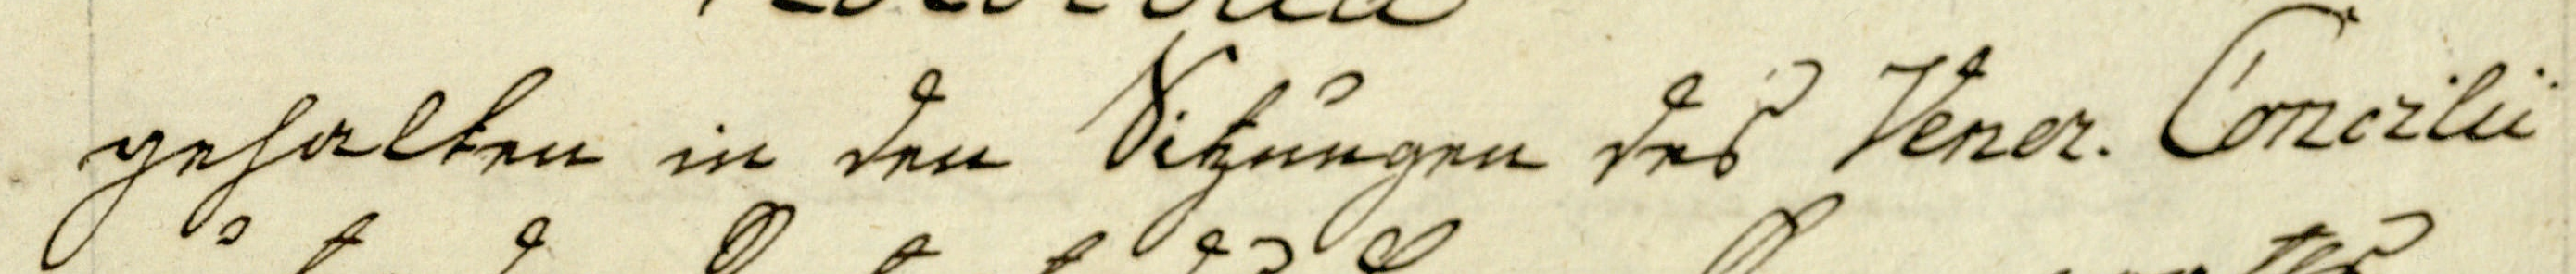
gehalten in den Sitzungen des Vener. Concilii
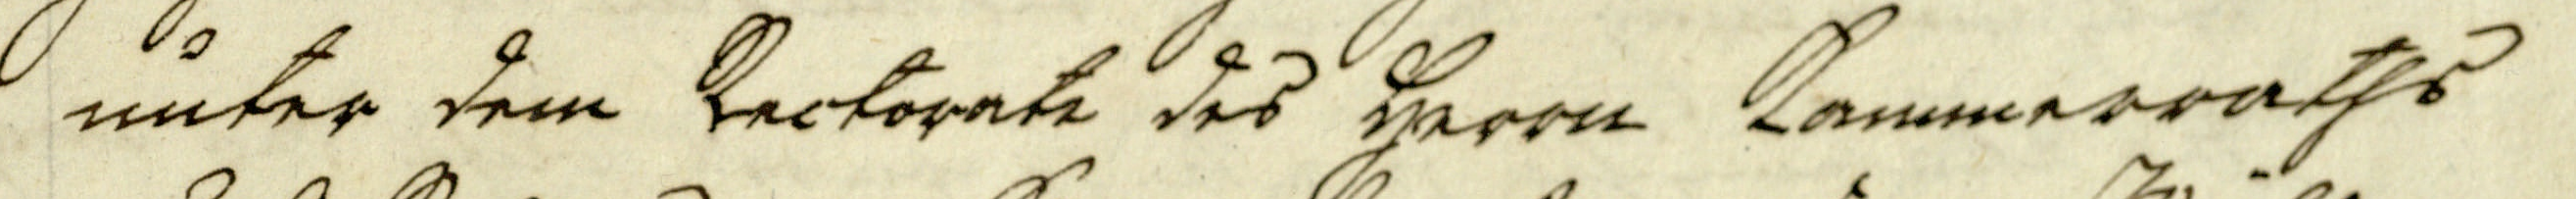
unter dem Rectorate des Herrn Kammerraths
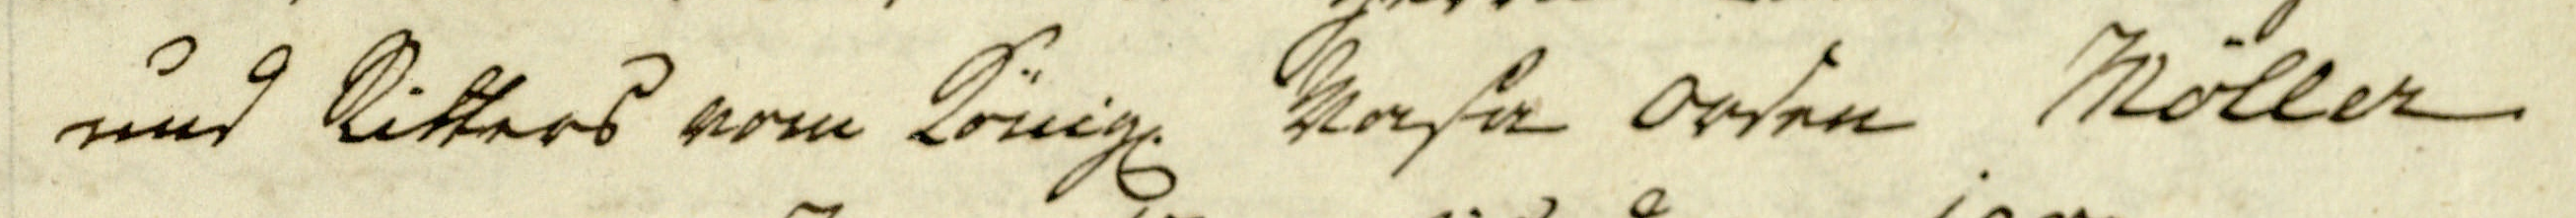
und Ritters vom Königl. Wasa Orden Möller
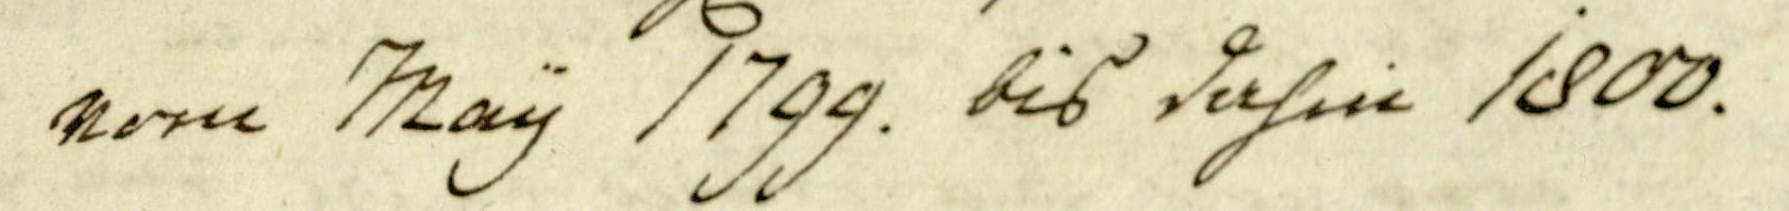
vom Maÿ 1799. bis dahin 1800.
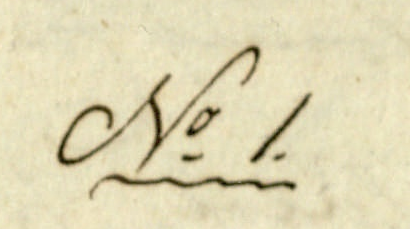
Nº 1.
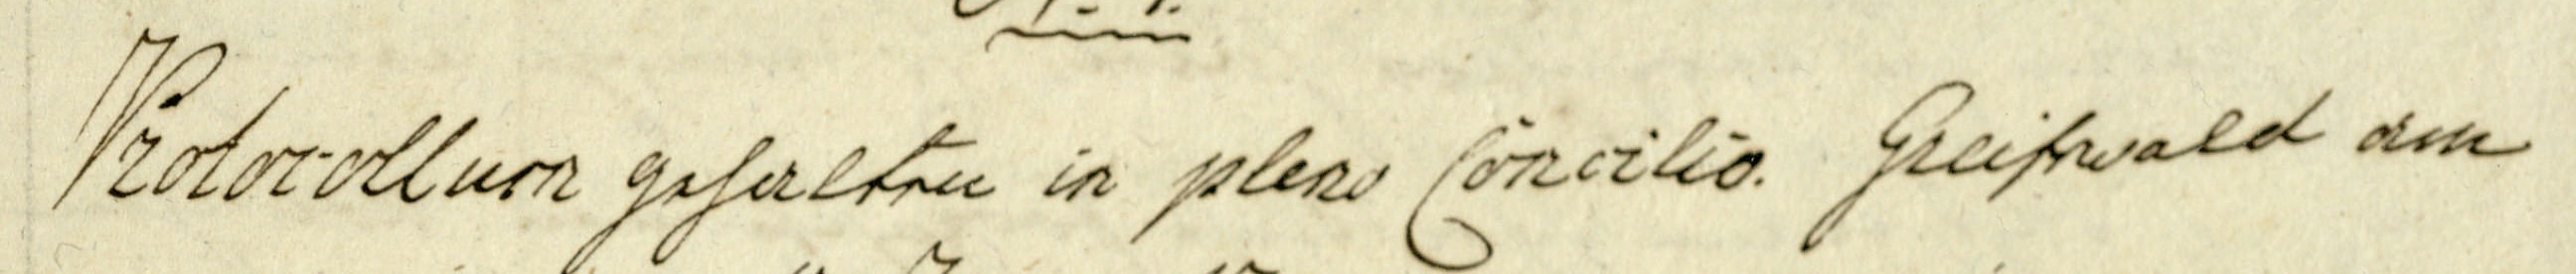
Protocollum gehalten in pleno Concilio. Greifswald am
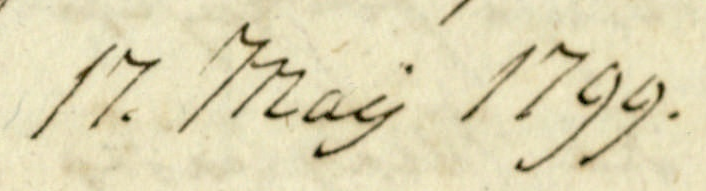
17. Maÿ 1799.
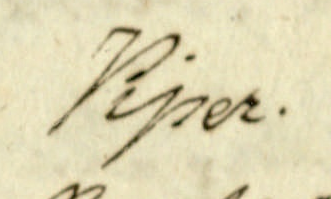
Piper.
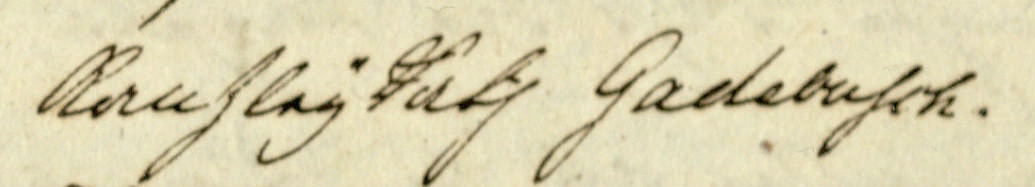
Kanzleÿ Rath Gadebusch.
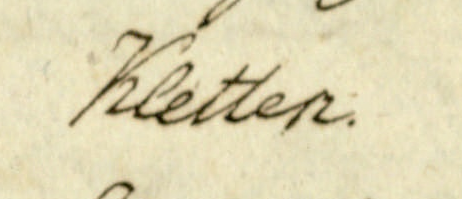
Kletten.
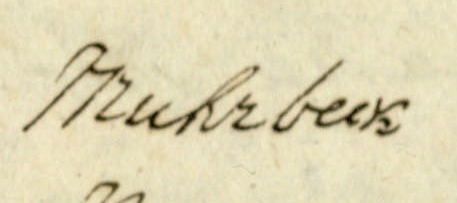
Muhrbeck
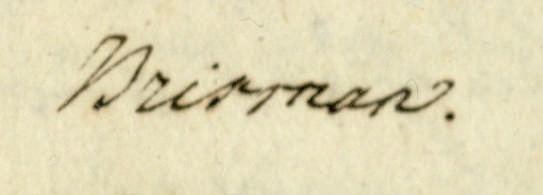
Brisman.
